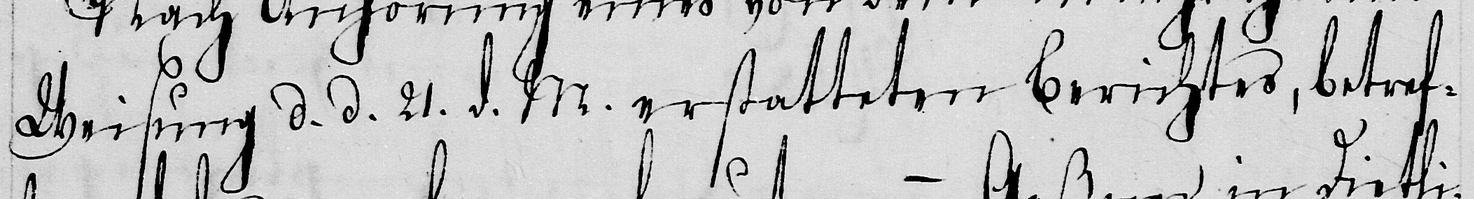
Weisung d. d. 21. d. M. erstatteten Berichtes, betref¬
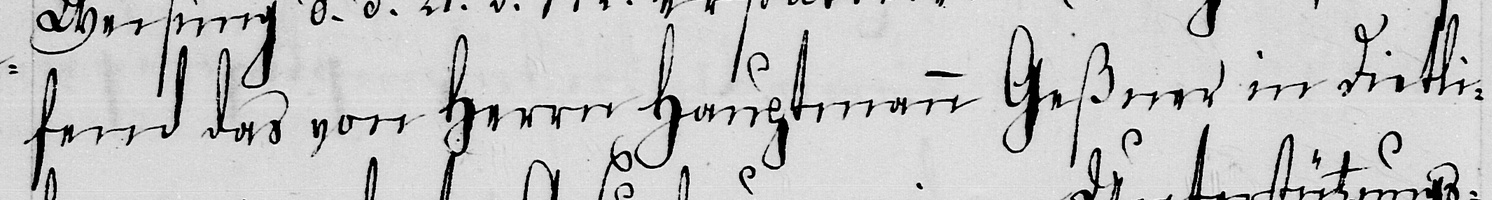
fend das von Herrn Hauptmann Geßner in Dietli¬
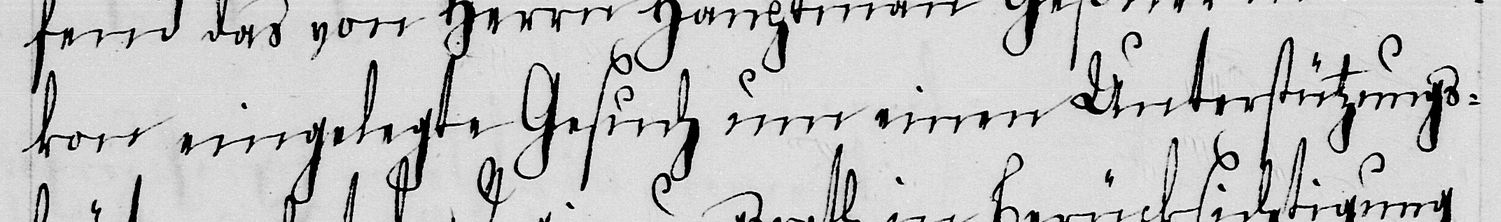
kon eingelegte Gesuch um einen Unterstützungs¬
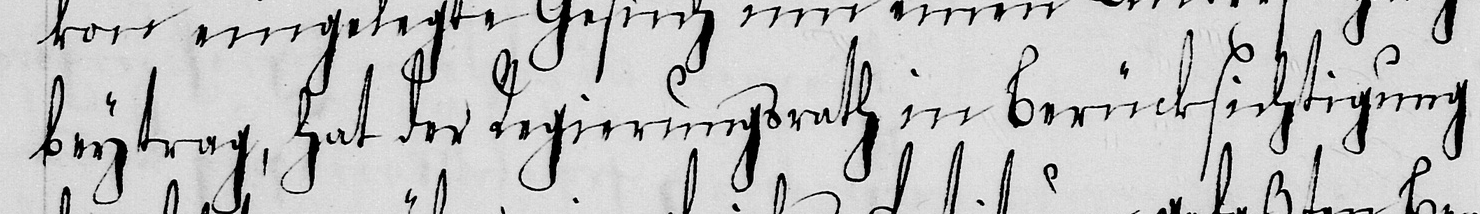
beytrag, hat der Regierungsrath in Berücksichtigung
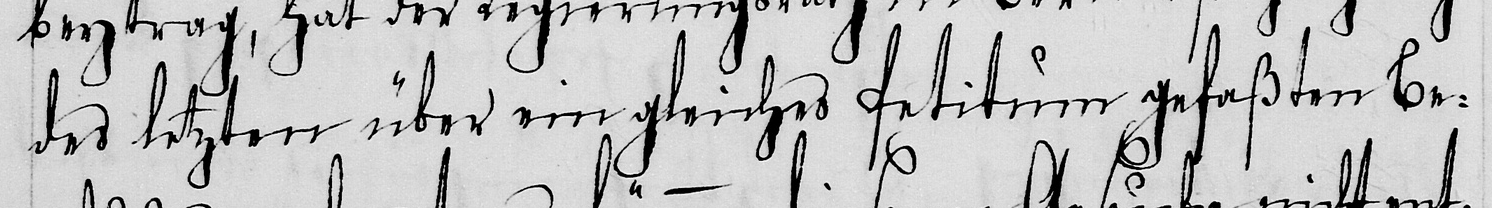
des letzten über ein gleiches Petitum gefaßten Be¬
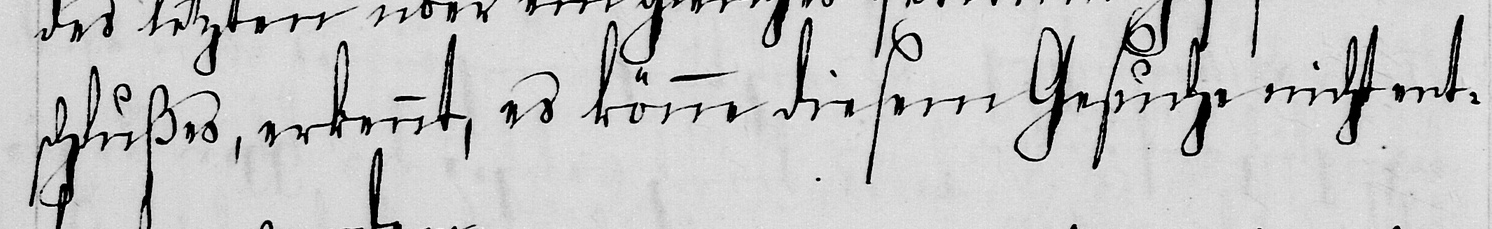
schlußes, erkennt, es könne diesem Gesuche nicht ent¬
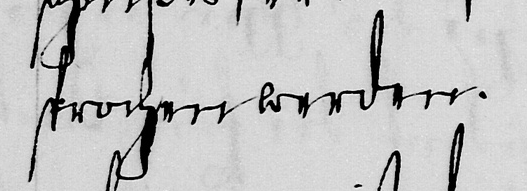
sprochen werden.
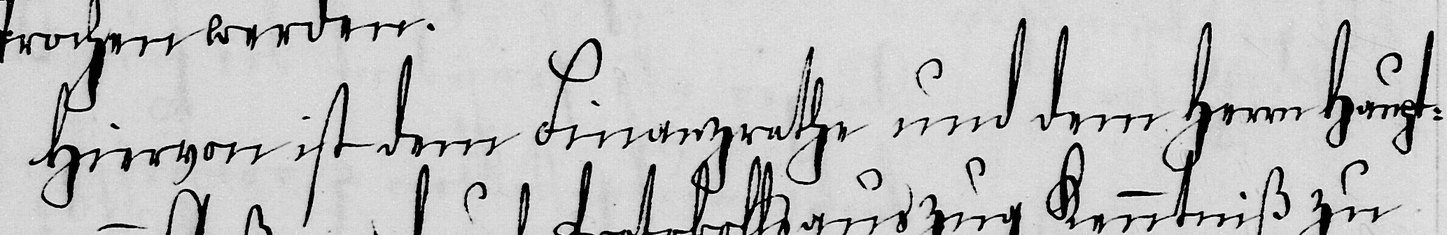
Hiervon ist dem Finanzrathe und dem Herrn Hau¬
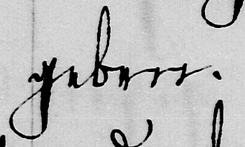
geben.
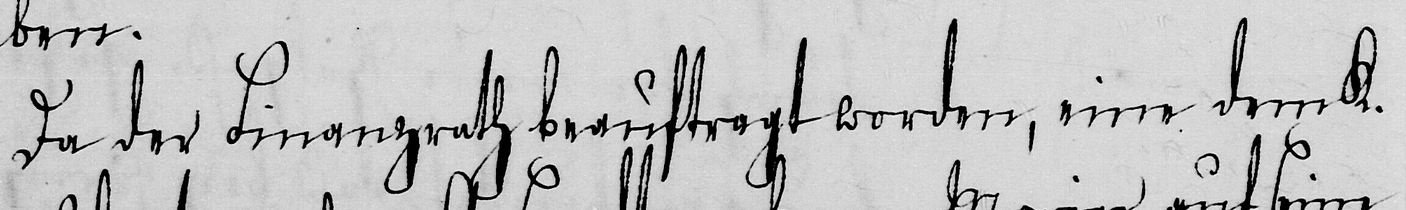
Da der Finanzrath beauftragt worden, eine dem K.
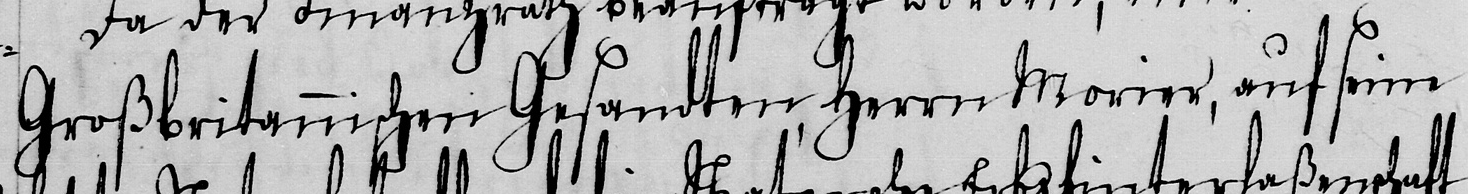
Großbritannischen Gesandten, Herrn Morier, auf seine
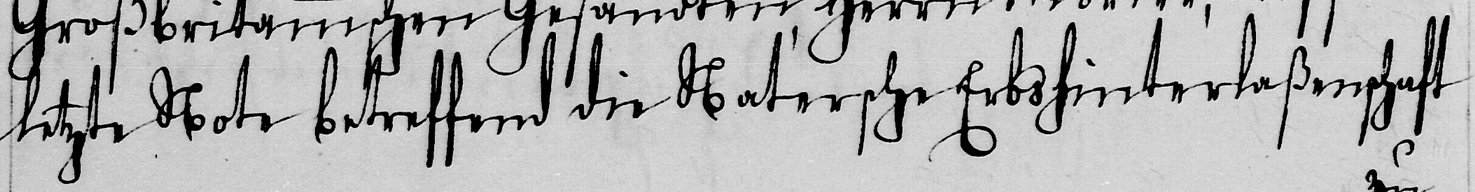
letzte Note betreffend die Natersche Erbshinterlaßenschaft
